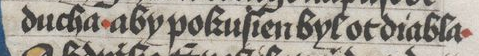ducha.aby pokuẛien byl ot diabla.
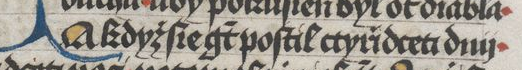A kdyż ſie ḡt poſtil ctyṙidceti dnij.
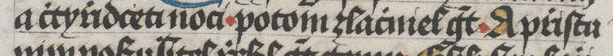a ċtyṙidceti noci.potom zlaċniel ḡt.A pṙiſtu¬
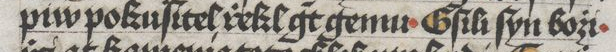piv pokuẛitel ṙekl ḡt gemu. Gſili ſyn bożi.
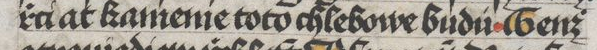ṙci at kameníe toty chlebowe budú.Genż
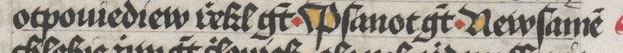otpouiedíew ṙekl ḡt.Pſanot ḡt.Newſamē
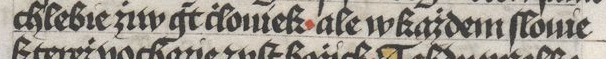chlebie żiw ḡt ċlowiek.ale wkażdem ſlouie
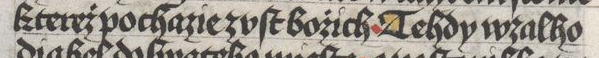ktereż pochazie zvſt bożich.Tehdy wzalho
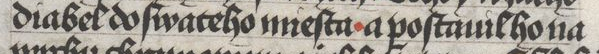diabel do ſwateho mieſta.a poſtauilho na
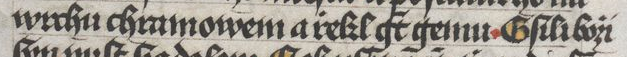wrchu chramowem a ṙekl ḡt gemu.Gſili bożí
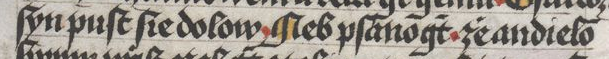ſyn puſt ſie dolow.Neb pſano ḡt.że andielō
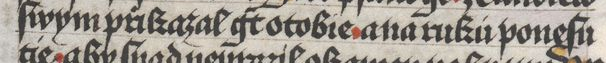ſwym pṙikazal ḡt otobie.a na rukú poneſu
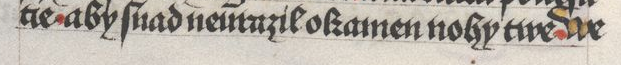tie.aby ſnad neurazíl okamen nohy twe.We¬
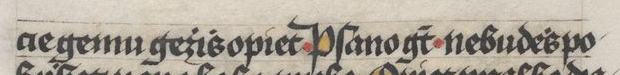cie gemu geżiṡ opiet.Pſano ḡt.nebudeṡ po¬
